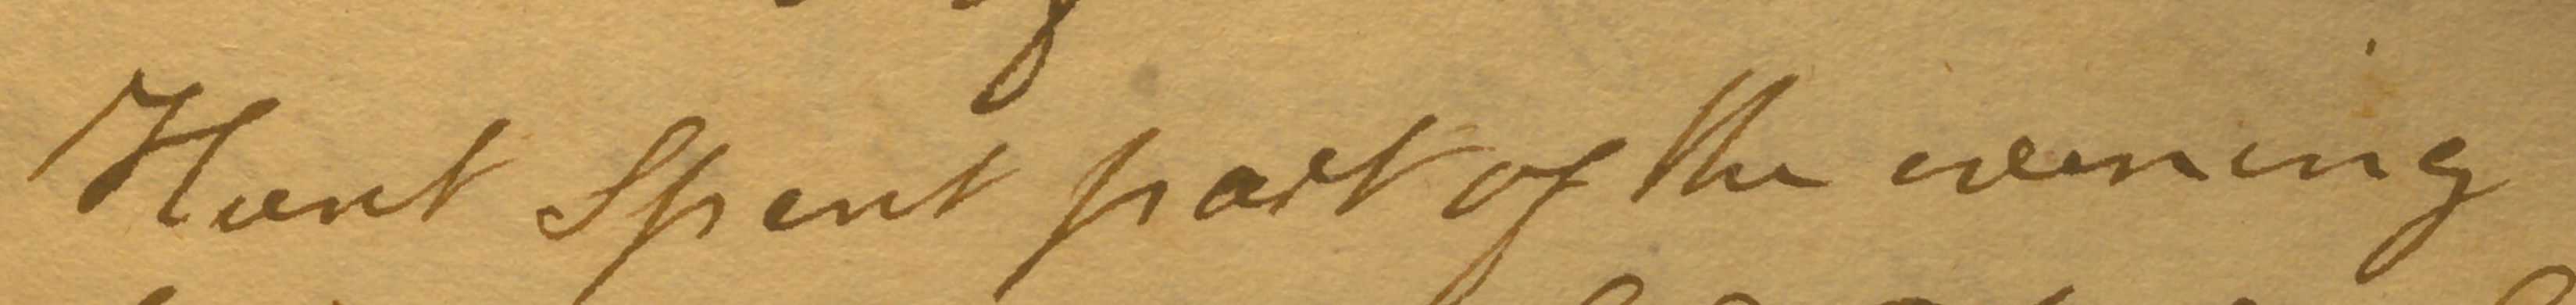Hunt Spent part of the evening
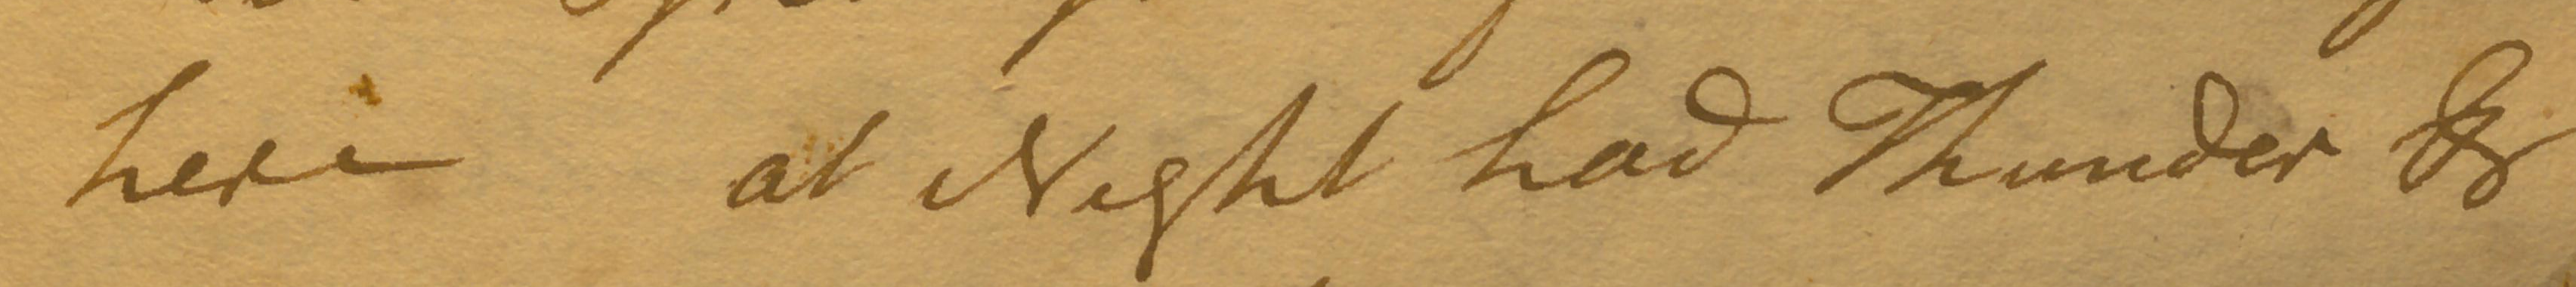here at Night had Thunder &
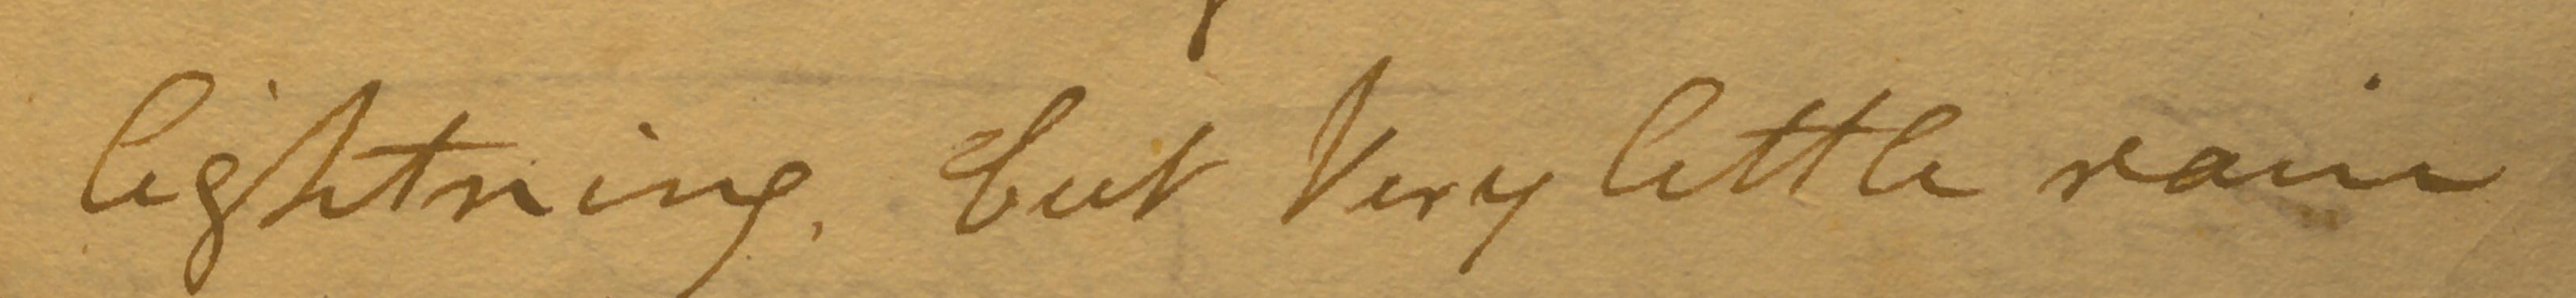lightning, but Very little rain
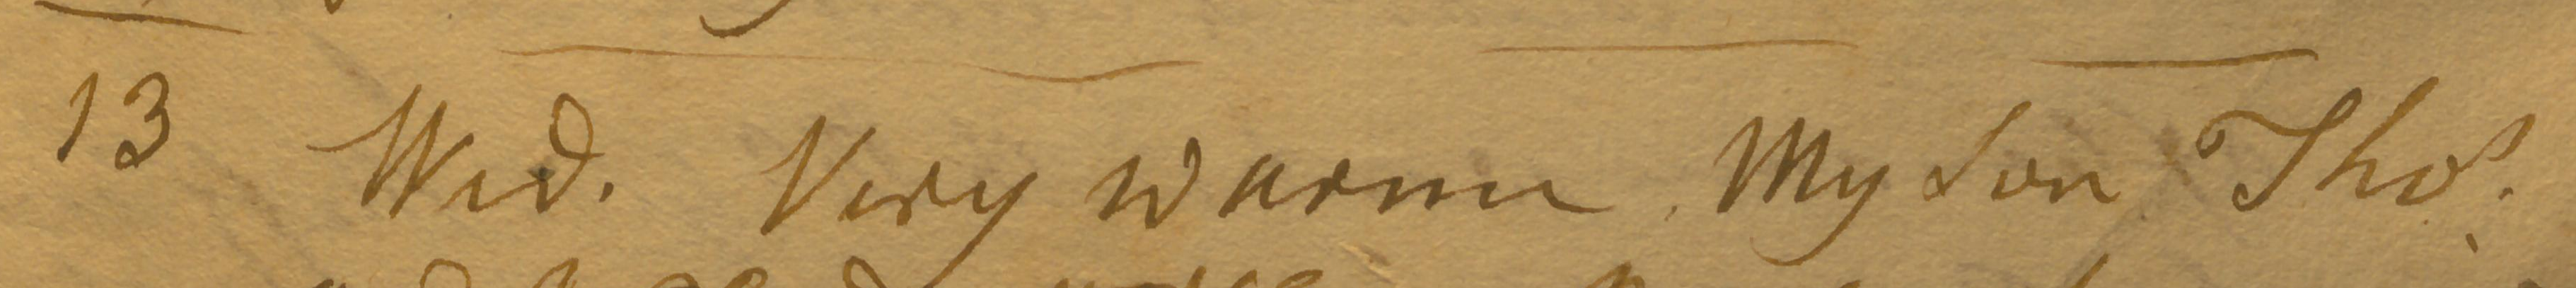13 Wed. Very warme My Son Tho^s.
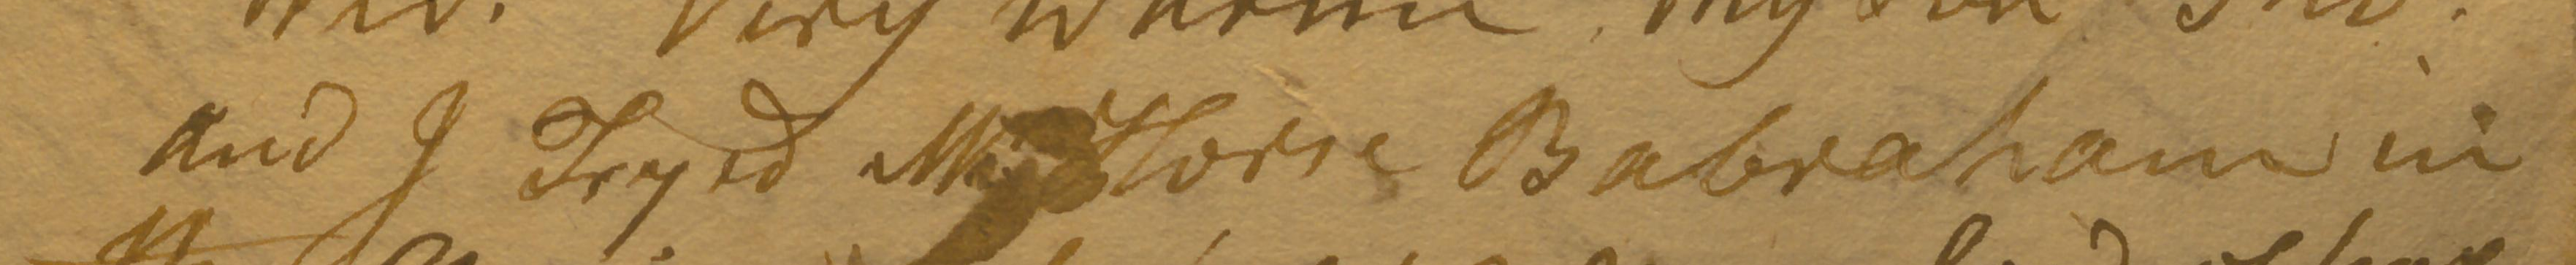and I Tryed My Horse Babraham in
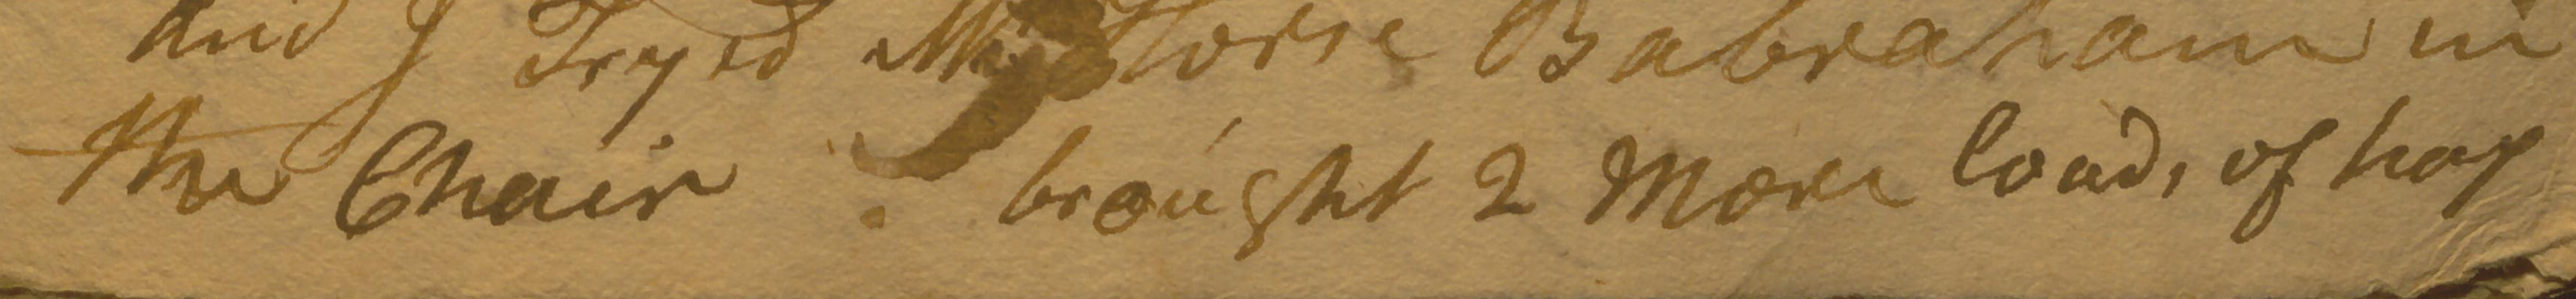the Chair brought 2 More load, of hay
